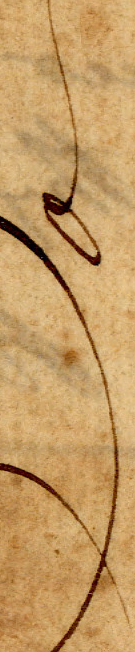To
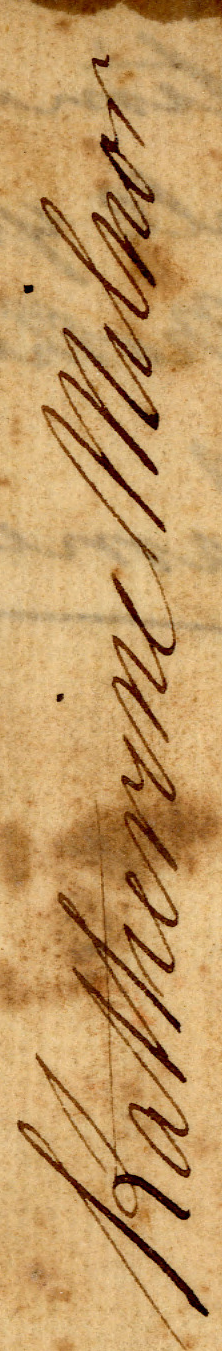Katherine Milnor
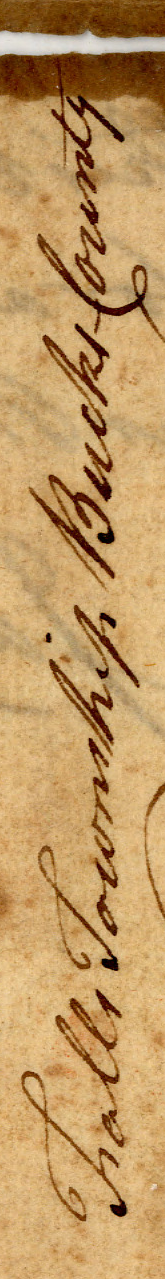Falls Tonwship Bucks-County
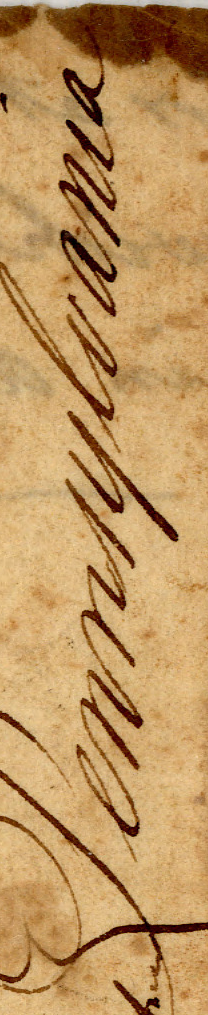Pennsylvania
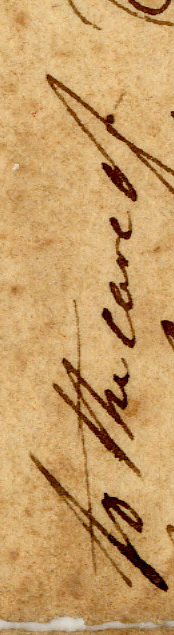to the care of
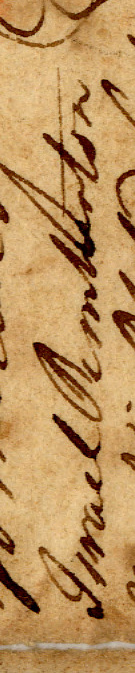Israel Pemberton
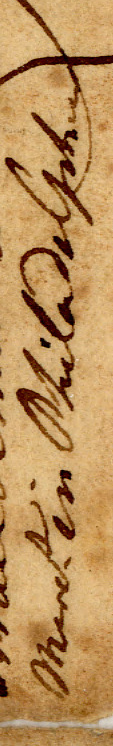Merc^t. in Philadelphia
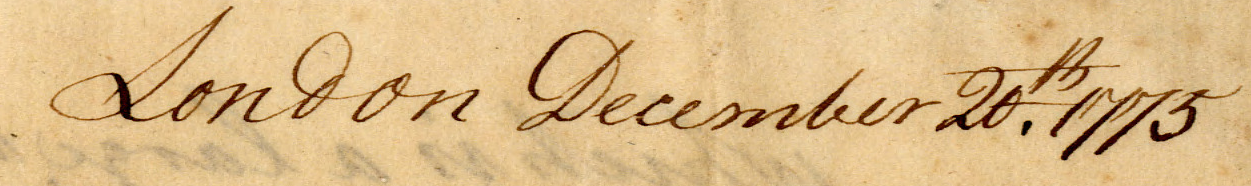London December 20^th. 1775
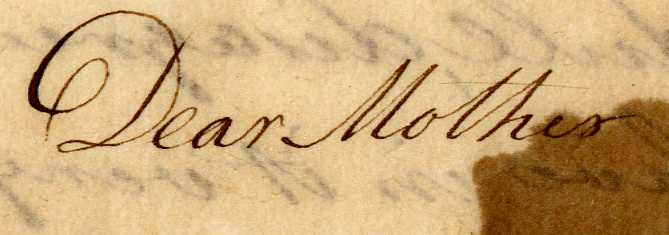Dear Mother
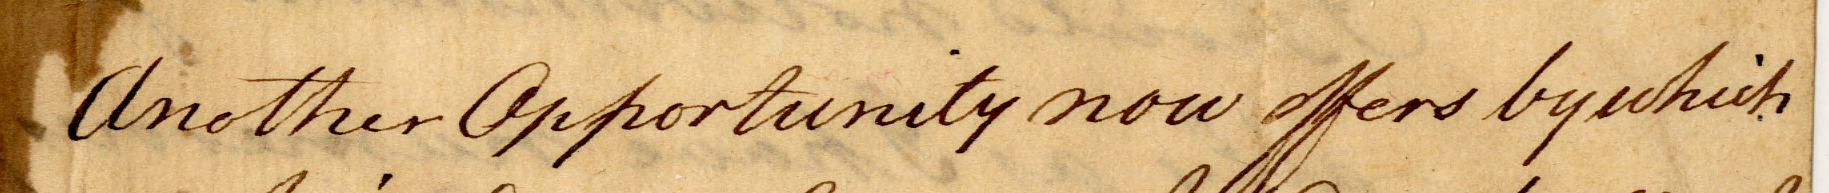Another Opportunity now offers by which
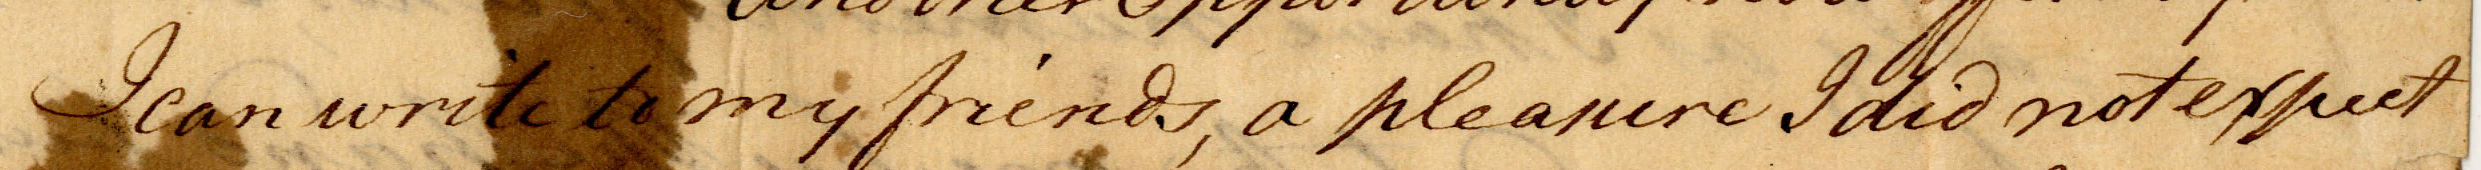I can write to my friends, a pleasure I did not expect
